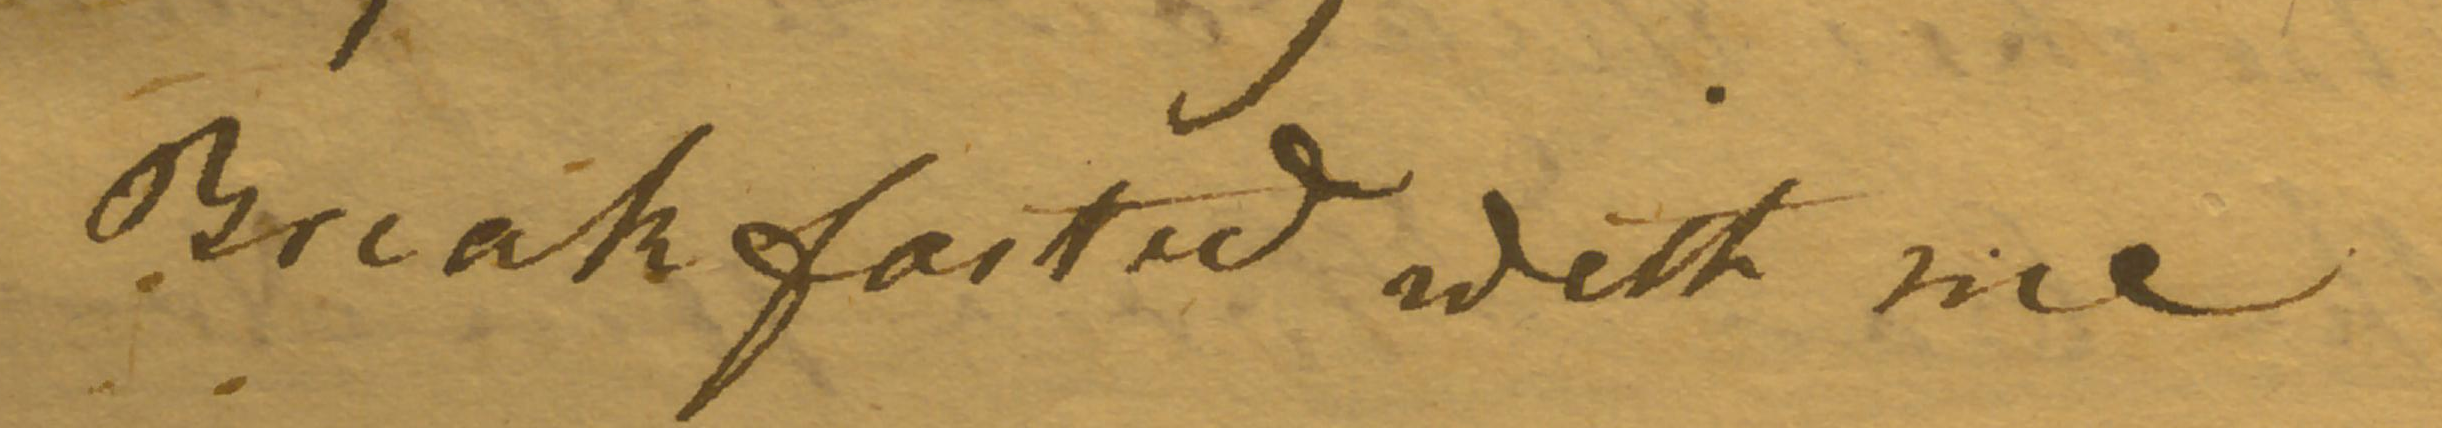Breakfasted with me
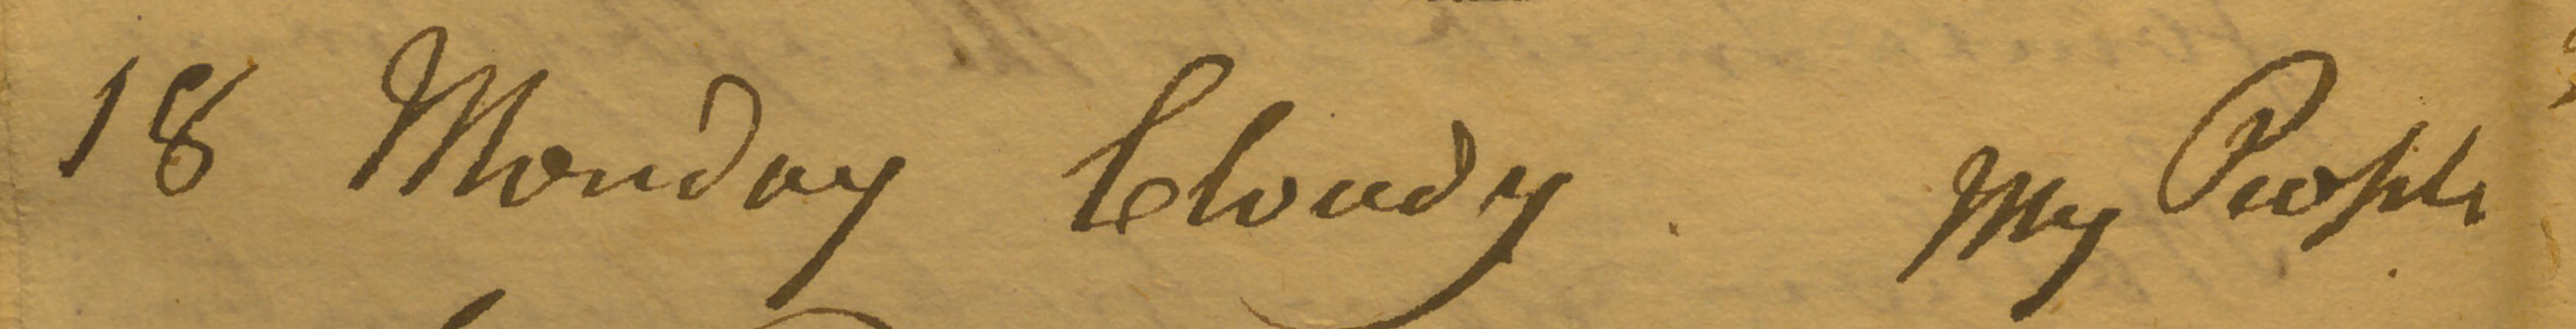18 Monday Cloudy. My People
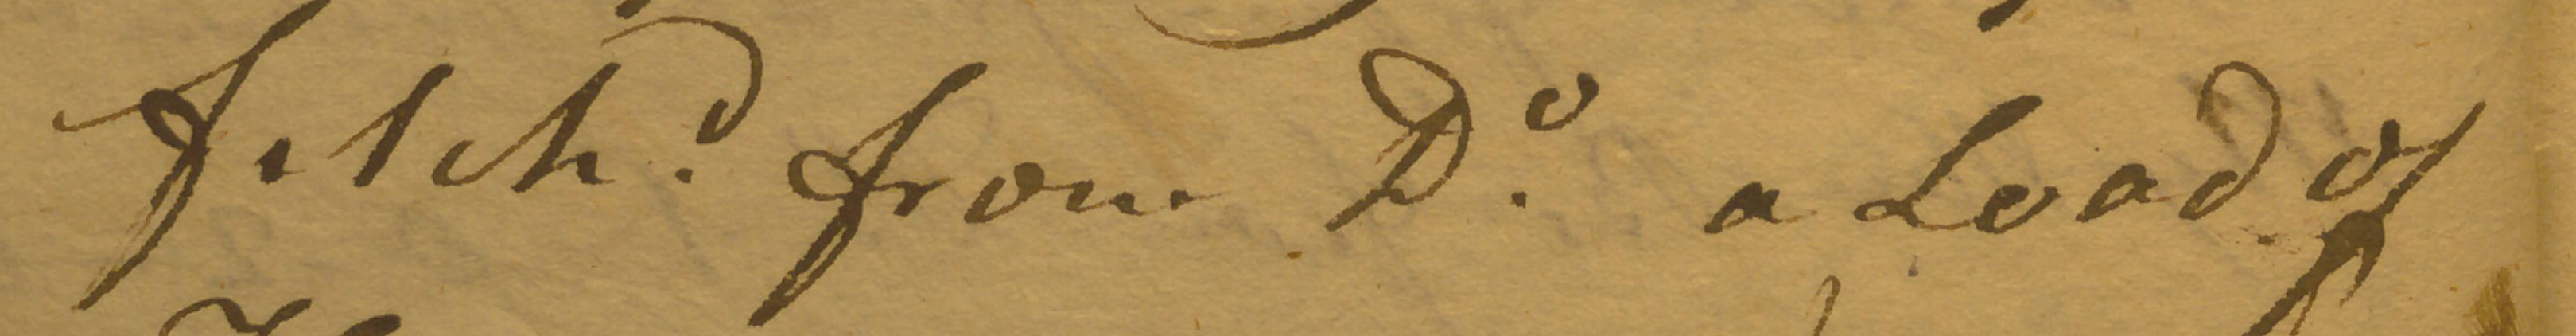fetch^d. from D^r. a Load of
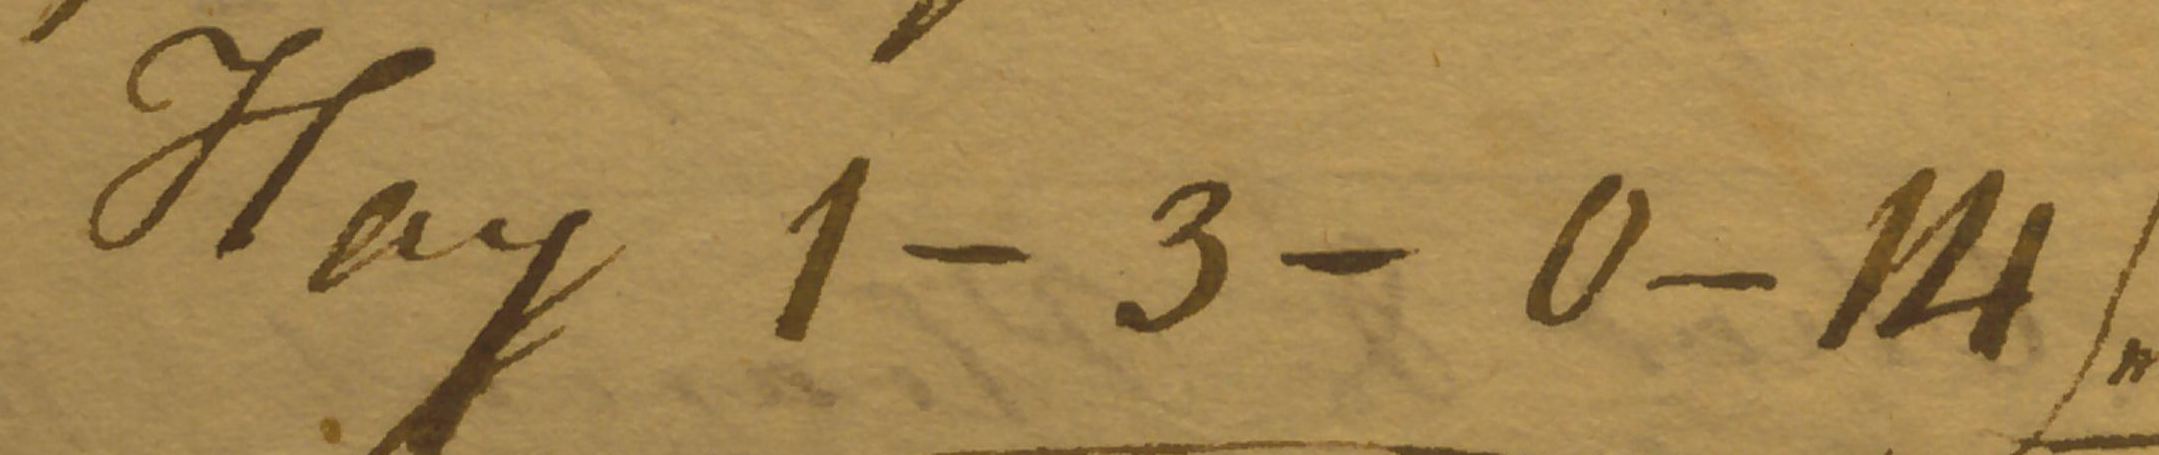Hay 1-3-0-14
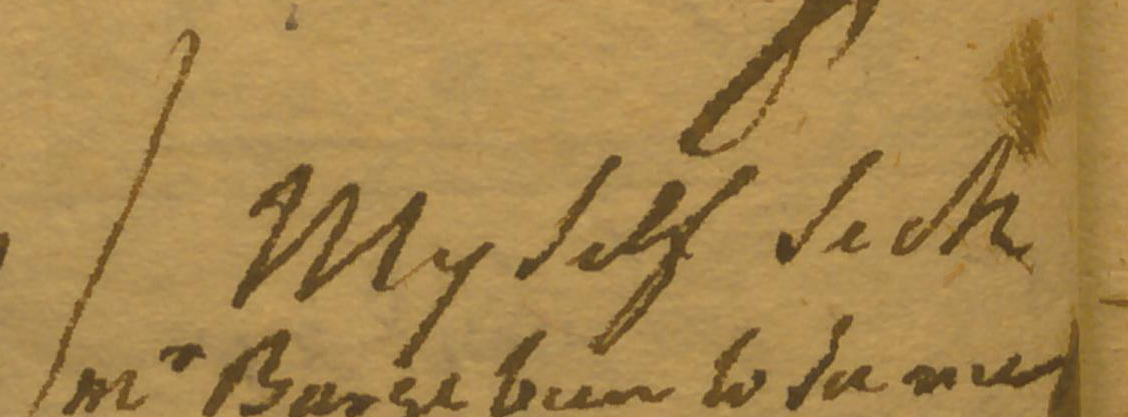My Self Sick
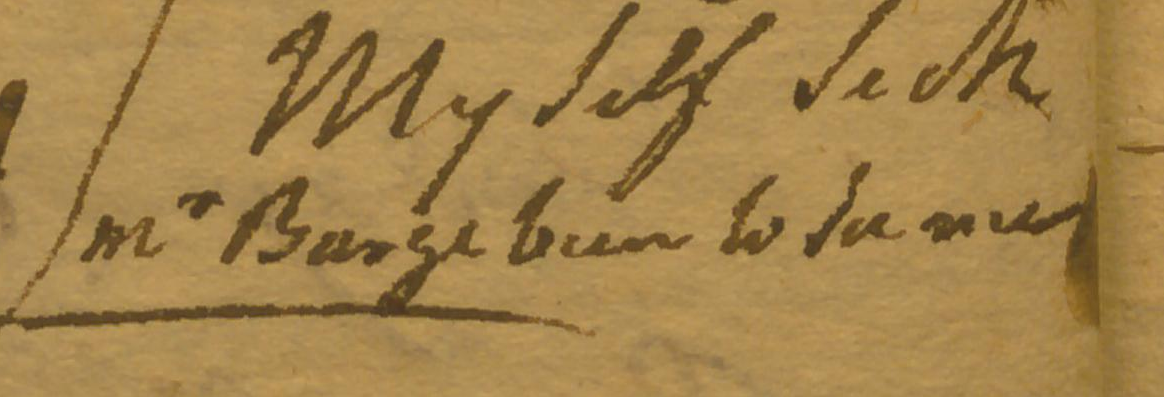M^r. Barge been to see me
